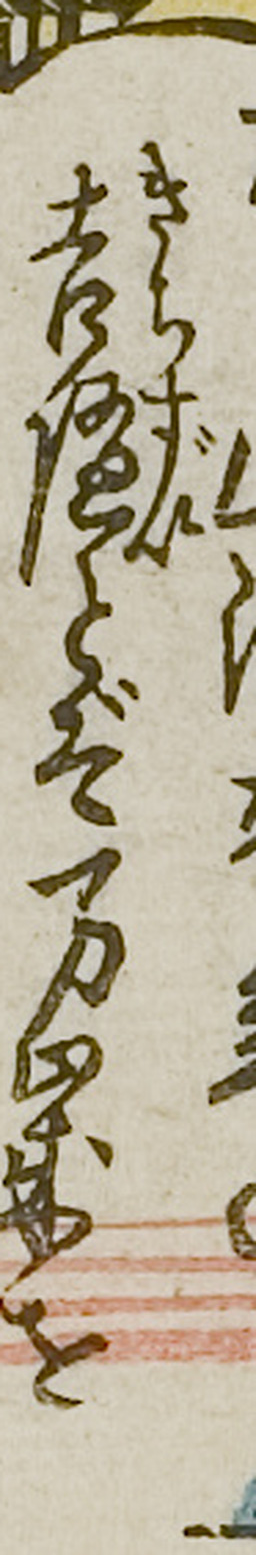吉随とぞ万歳を
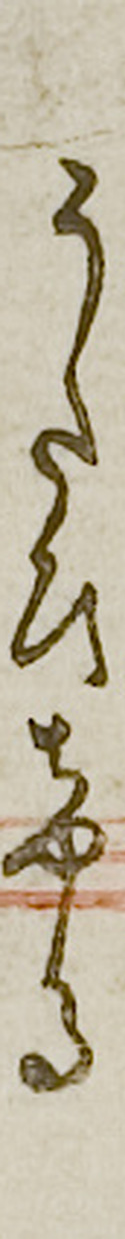うたひける
